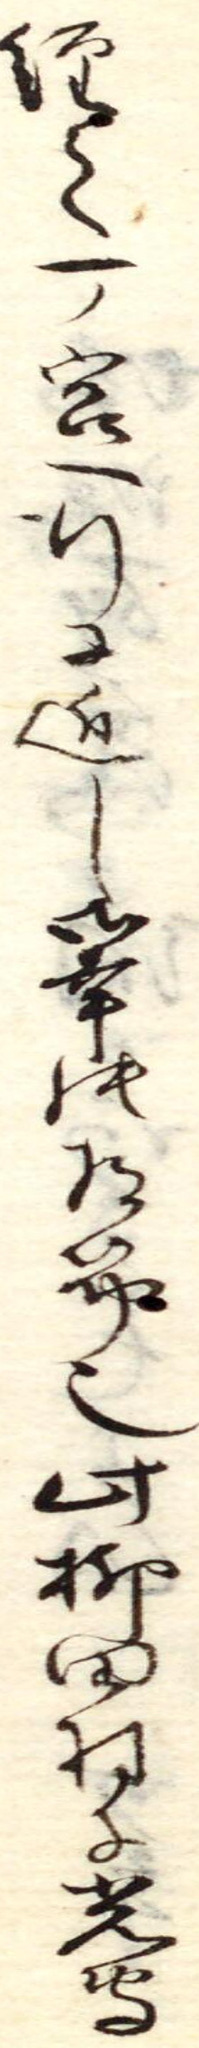経て一ノ宮へ行に近し御幸の道筋也此柳田村に光守
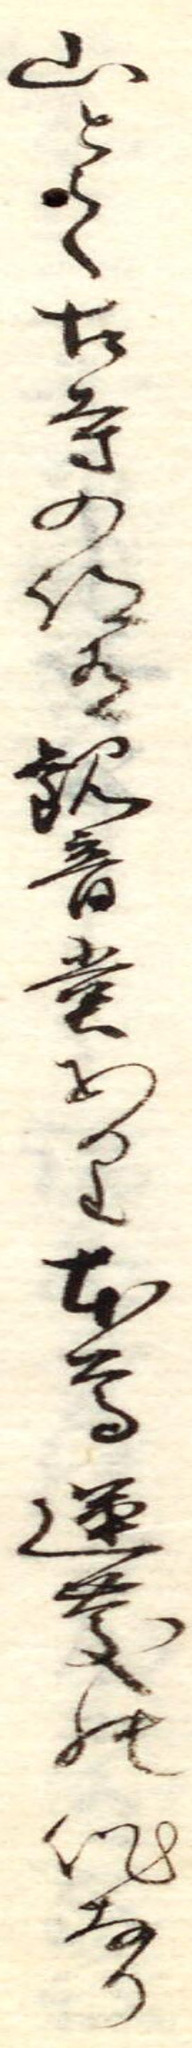山とて古寺の跡有観音堂あり本尊運慶の作なり
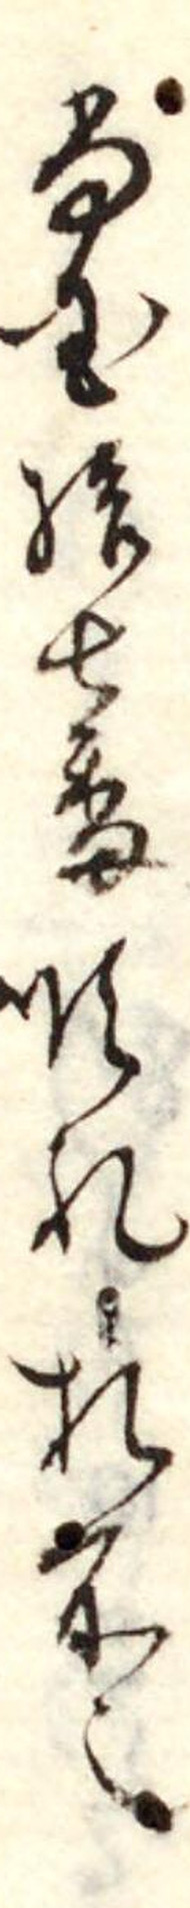当国拾七番順礼札所也
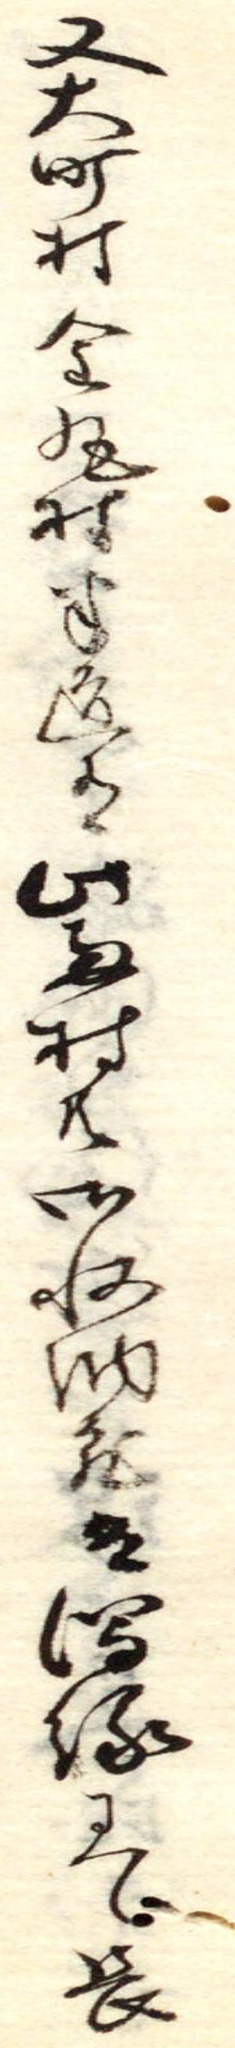又大町村金丸村半道有此両村共御収納蔵は潟縁にて長
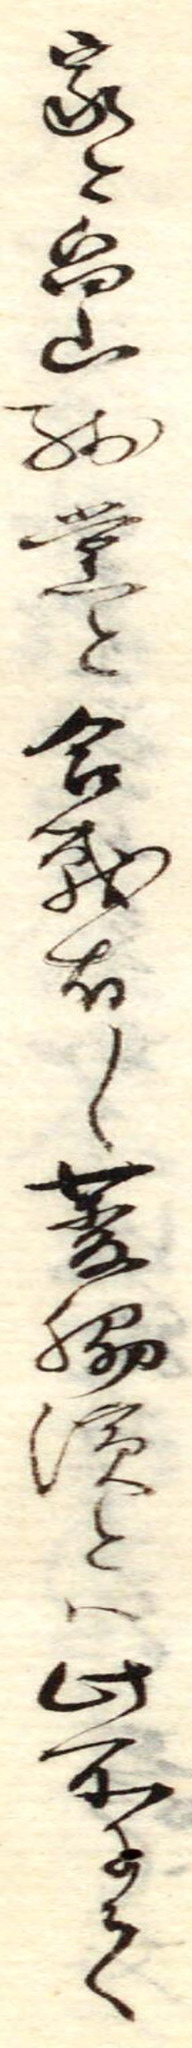家と畠山残党と合戦有し菱脇浜とは此所にて
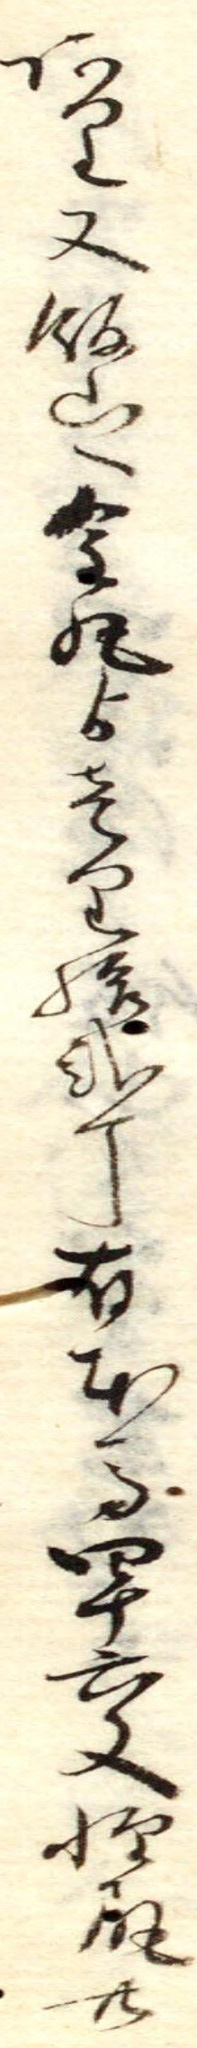あり又飯山へ金丸ゟ壱里拾弐丁有本馬四十六文軽尻廿
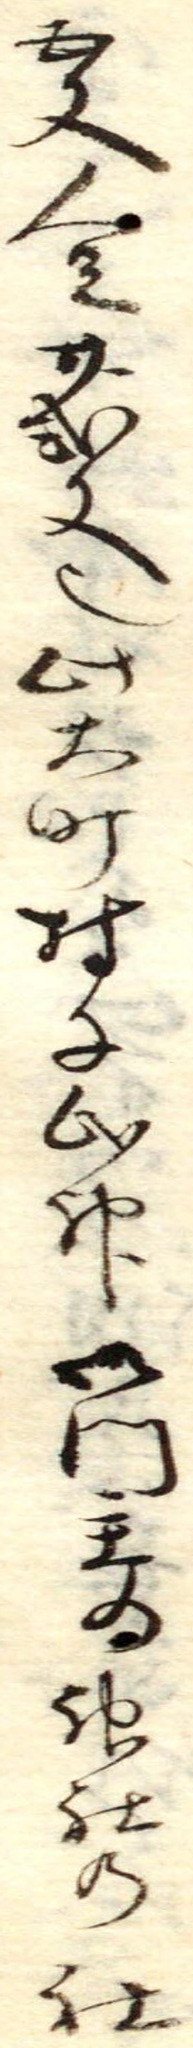五文人足廿弐文也此大町村に氏神御門主為神社の社

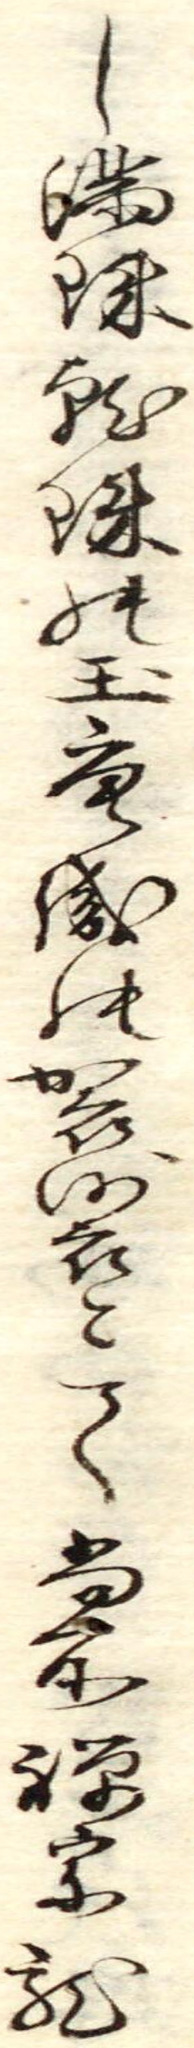し満珠乾珠の玉唐織の袈裟とて当所禅宗龍
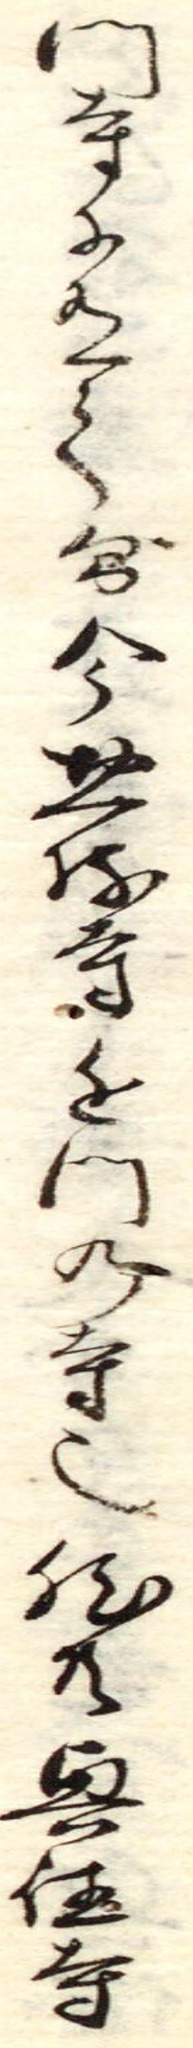門寺に有て則今惣持寺近門の寺也然共興徳寺
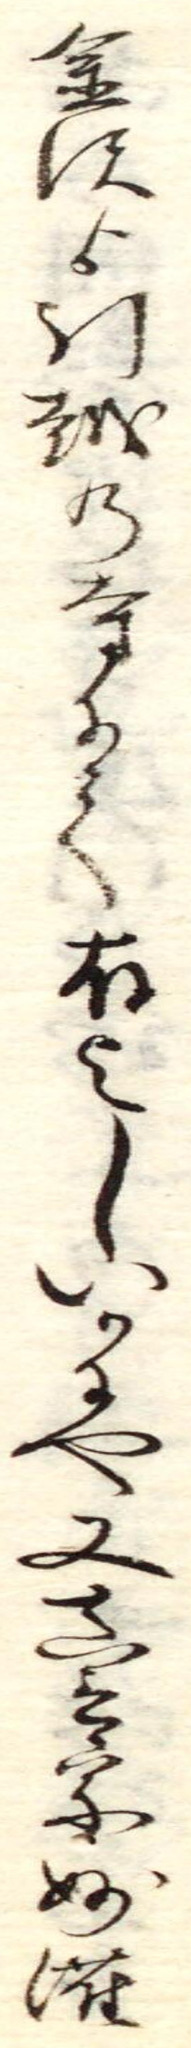金沢ゟ引越の寺にて有よしいかにや又真言宗妙灌
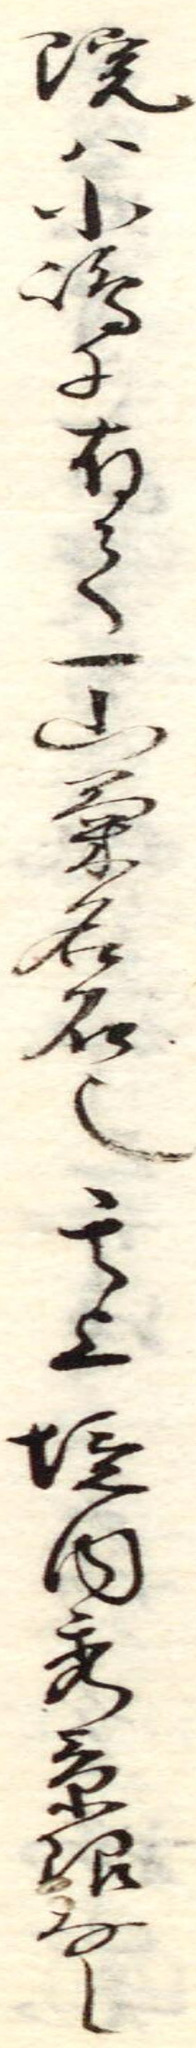院は小嶋に有て一山菊名石也其上境内秀景限なし
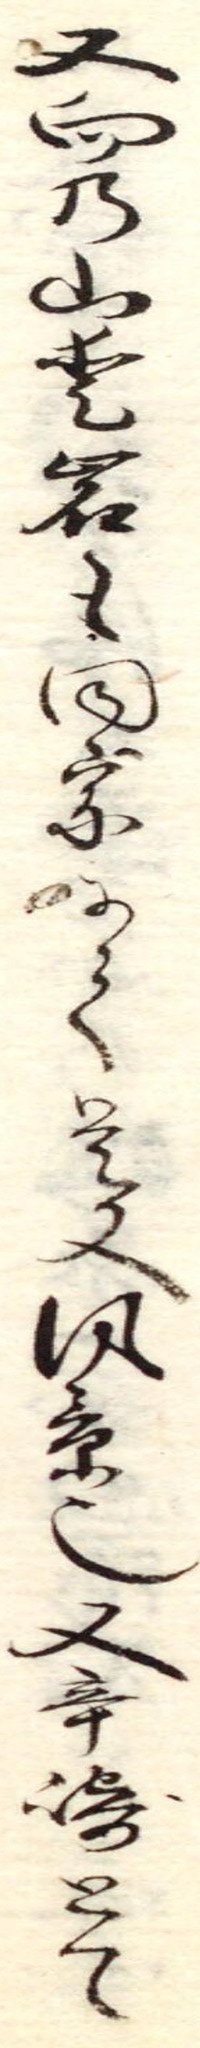又向の山愛岩も同宗にて是又風景也又辛崎とて
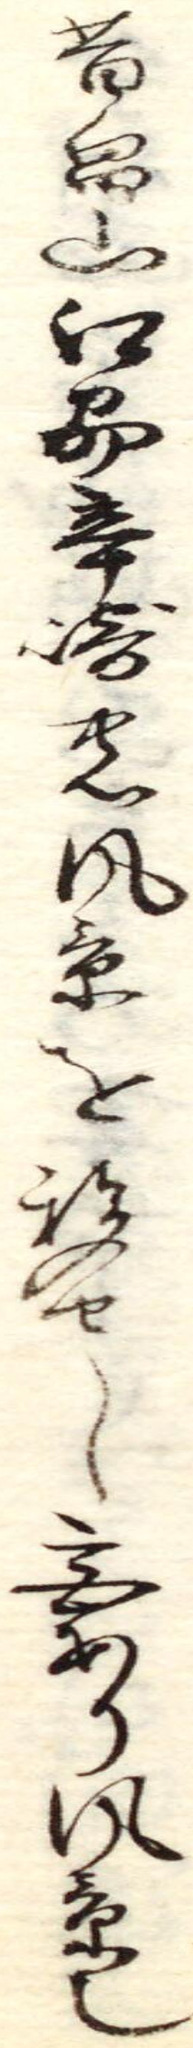昔畠山江州唐辛崎風景を移せし宮あり風景也
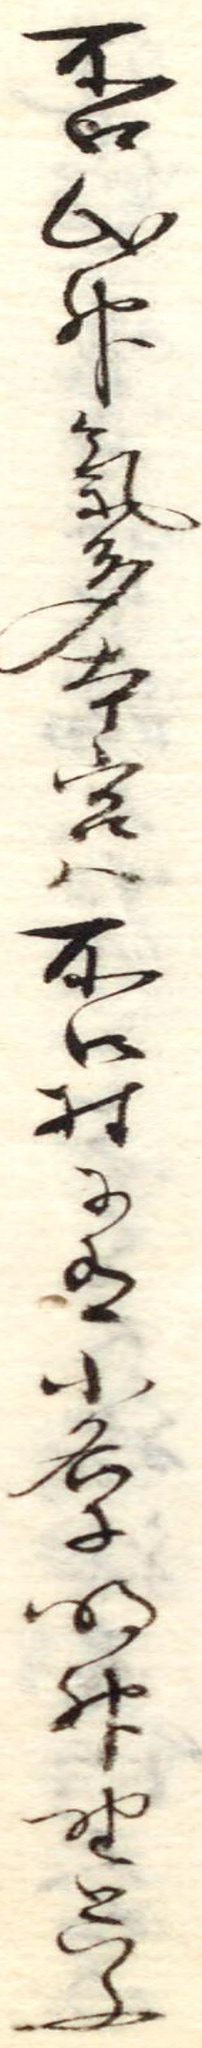所口氏神気多本宮は所口村に有小名に明神野といふ
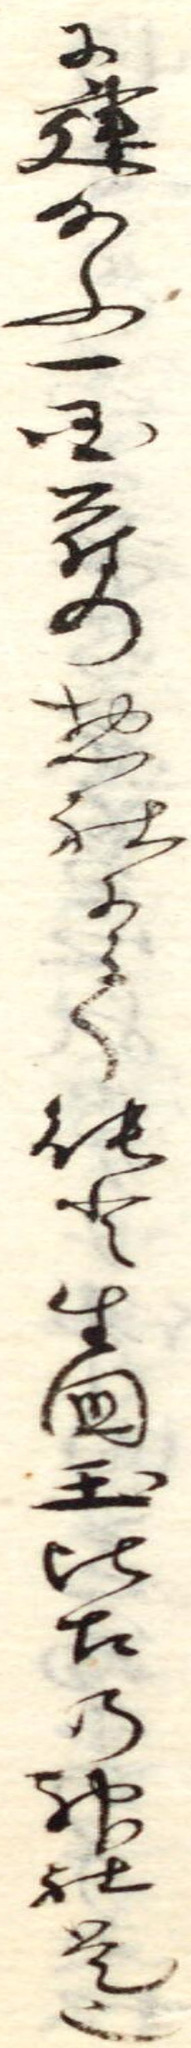に建給ふ一国府の惣社にて能登生国玉比古の神社是也
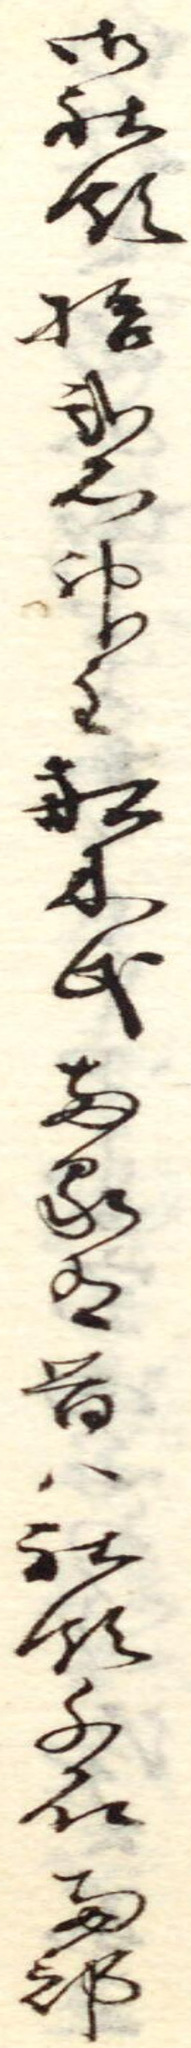御社領拾弐石神主船木氏両家有昔は社領千石両郡
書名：能登名跡誌
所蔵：Ishikawa Prefectural Library
